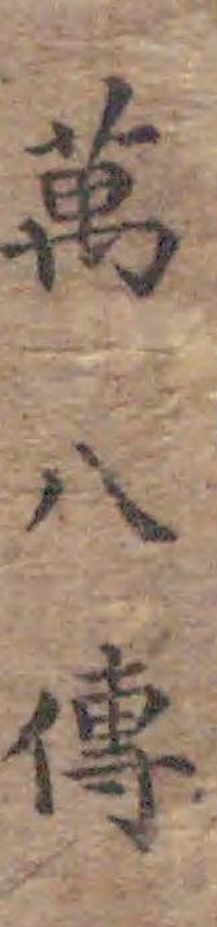万八伝
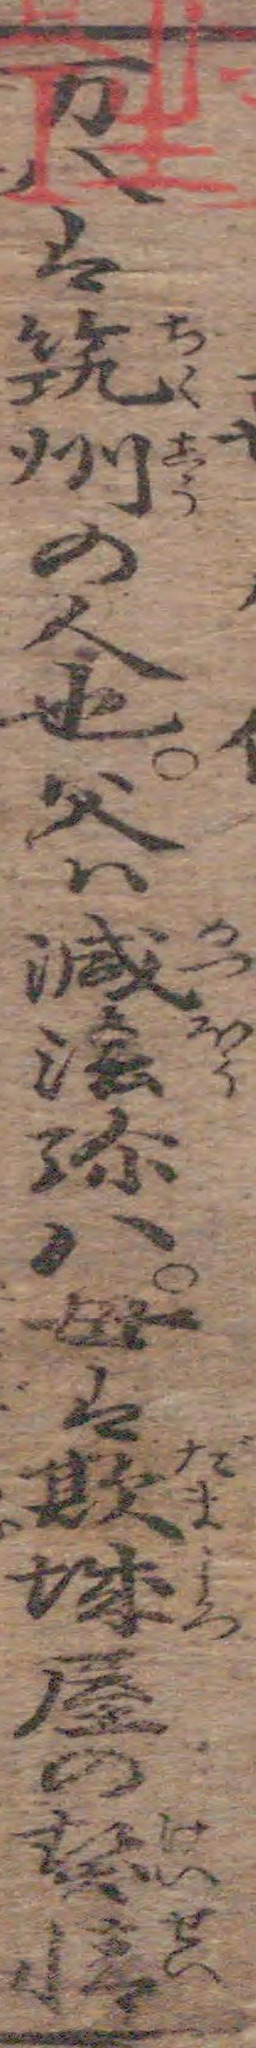万八は筑州の人也。父は滅法弥八。母は欺城屋の契情
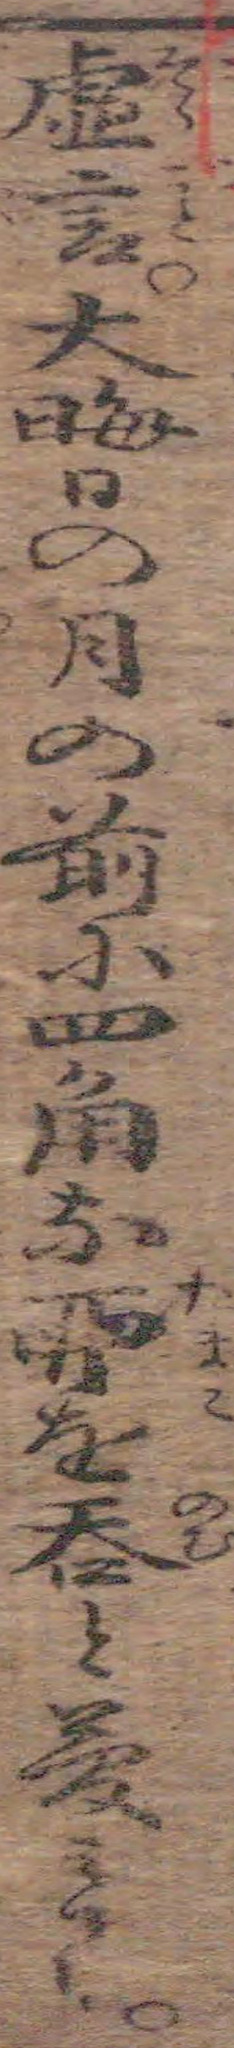虚言。大晦日の月の前に四角な卵を呑と夢みて。
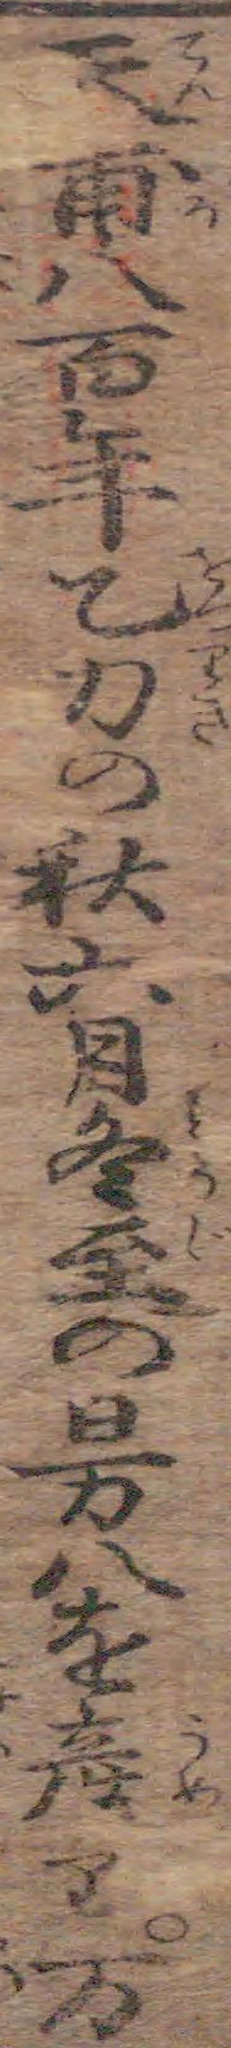天甫八百年乙力の秋六月冬至の日万八を産り。万
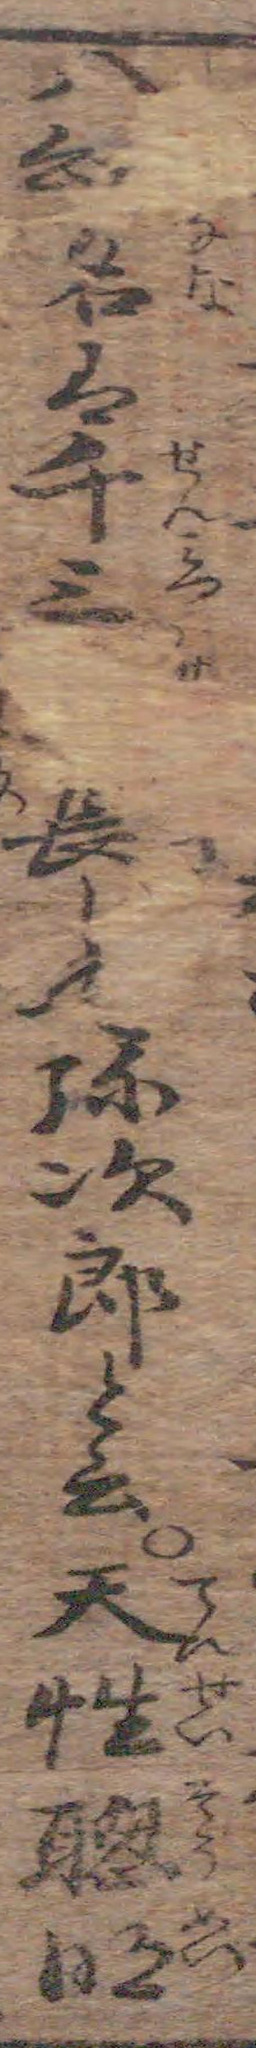八幼名は千三。長弥次郎と云。天性聡明
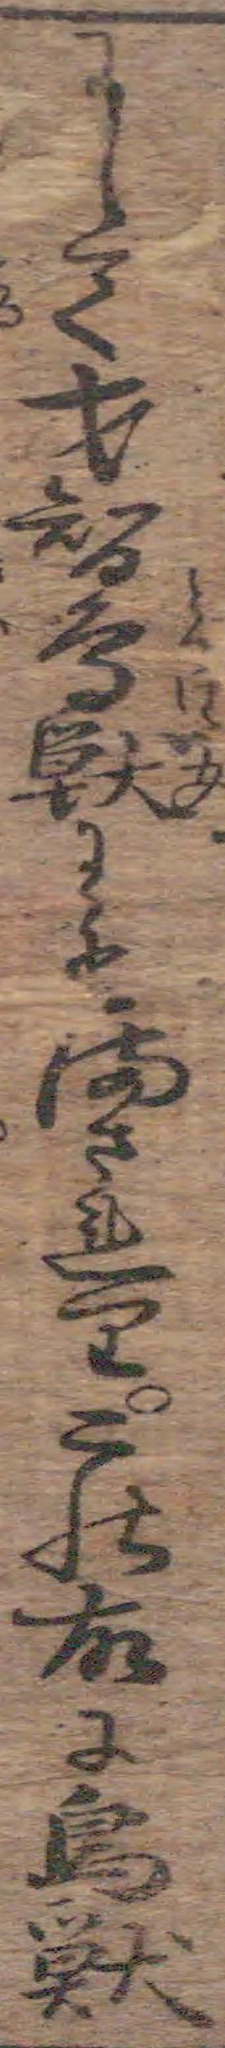にして才智鳥獣にもまされり。この故に鳥獣
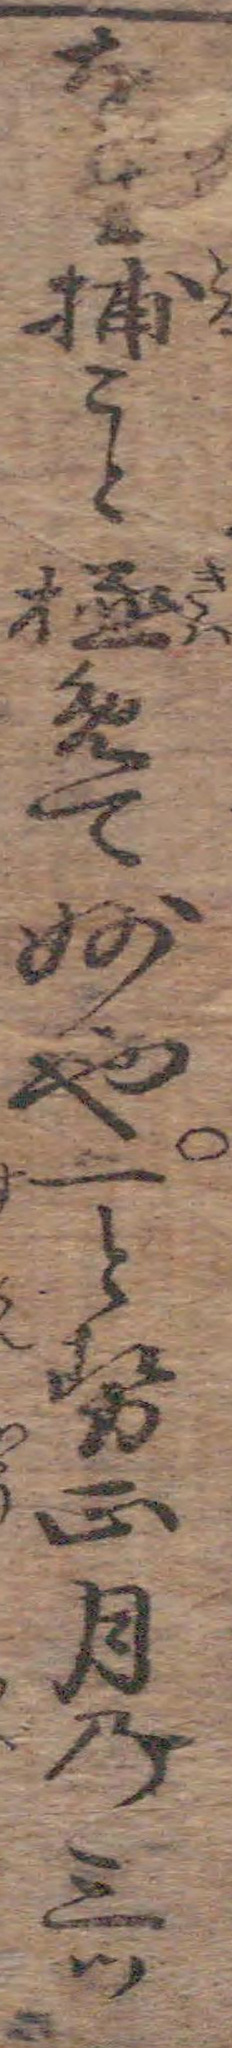を生捕こと極めて妙也。一とせ正月の三つ
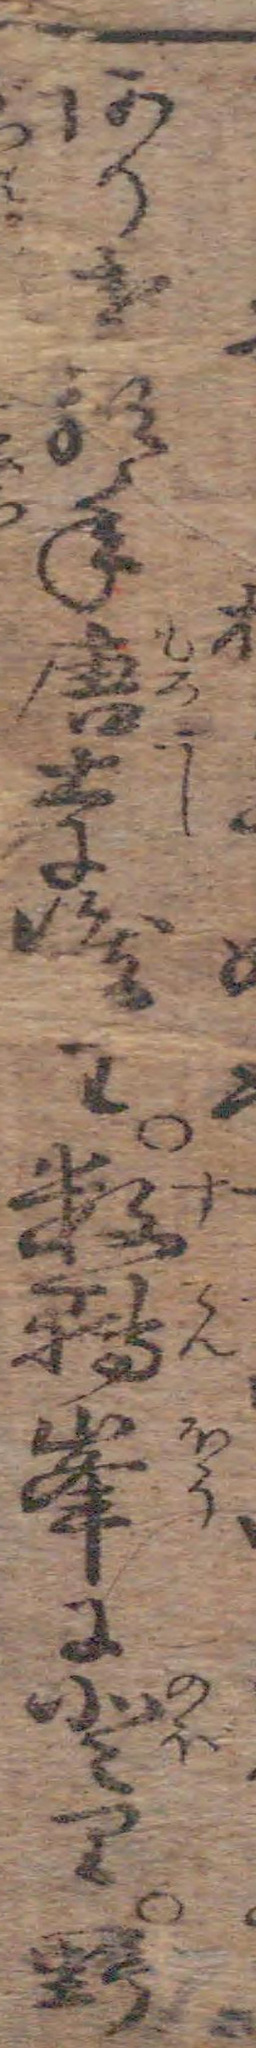ありける年唐土に渡り。数転峯に登り。野
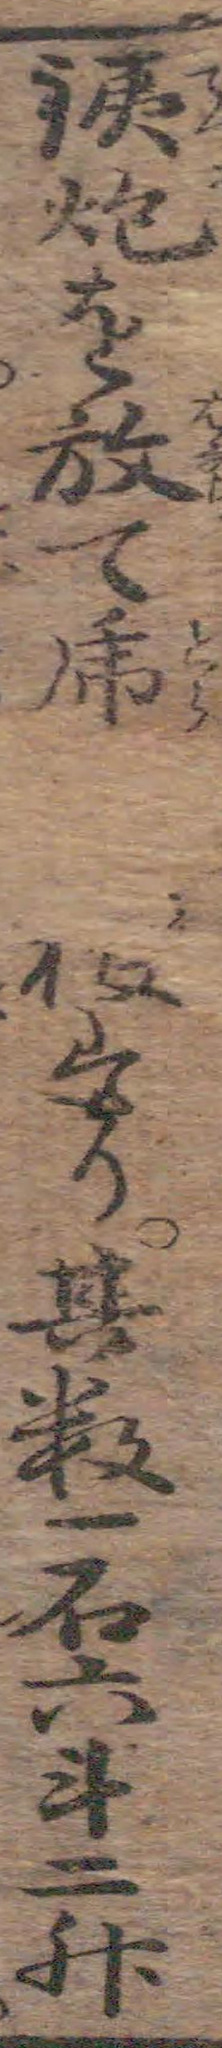銕炮を放て虎たり。其数一石六斗二升
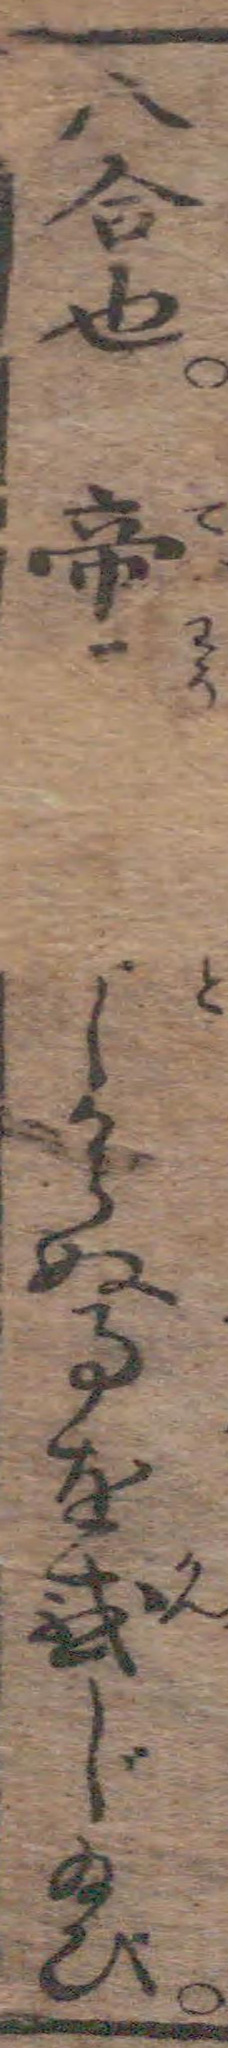八合也。帝王しからぬ事を感じ給ひ。
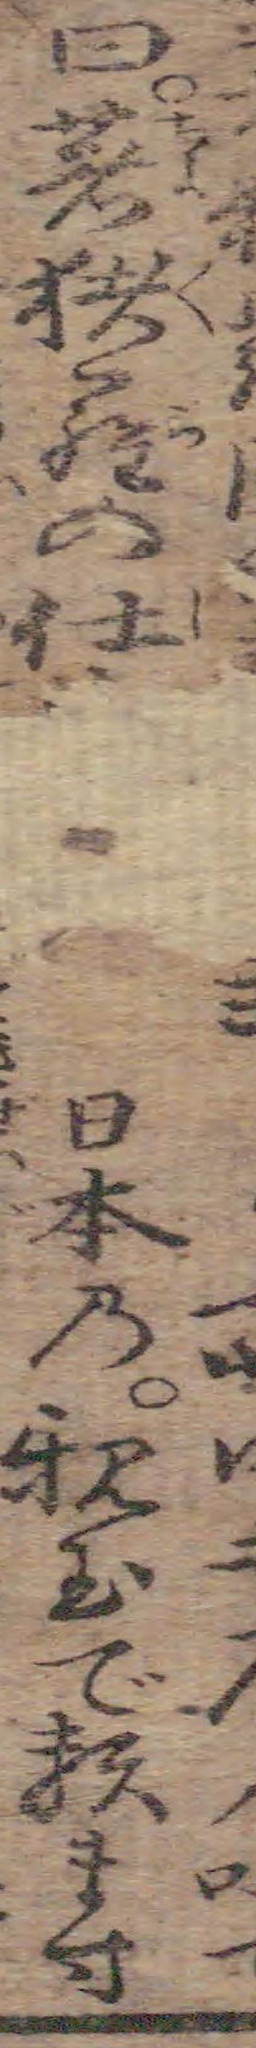曰。著猪羅の仕日本の。親玉でます
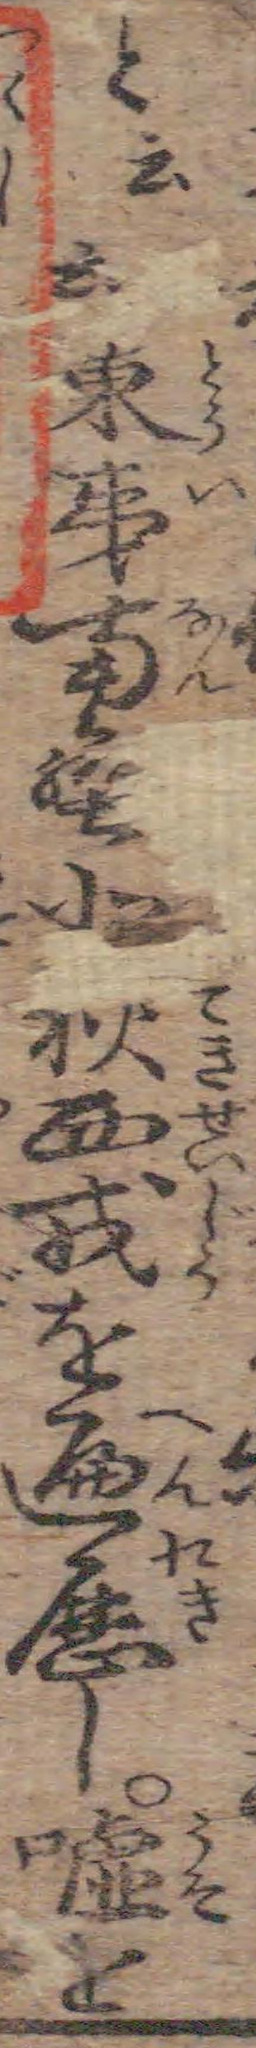と云云東夷南蛮北狄西戎を遍歴し。嘘を
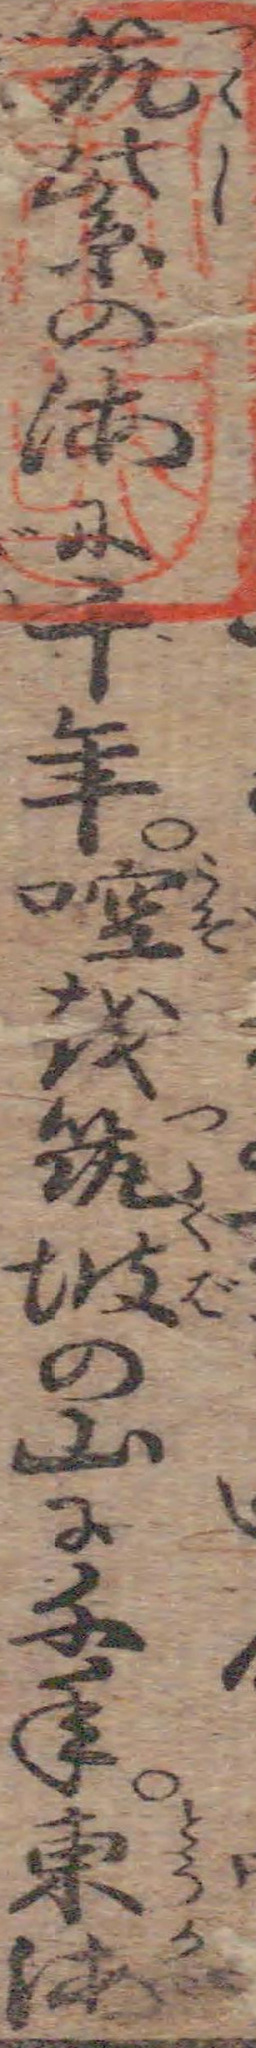筑紫の海に千年。啌を筑坡の山に千年。東海
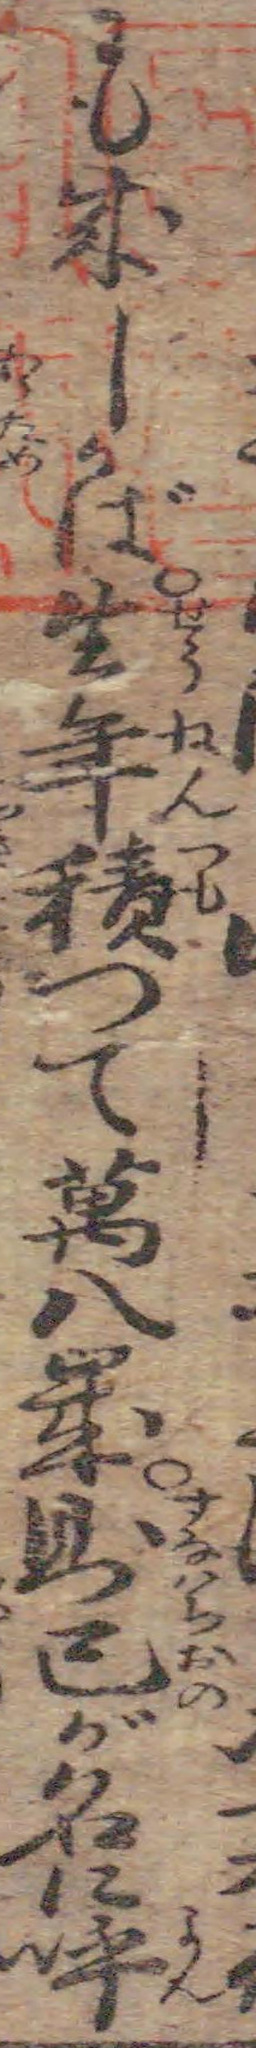にも成しかば。生年積つて万八歳。則己が名に呼
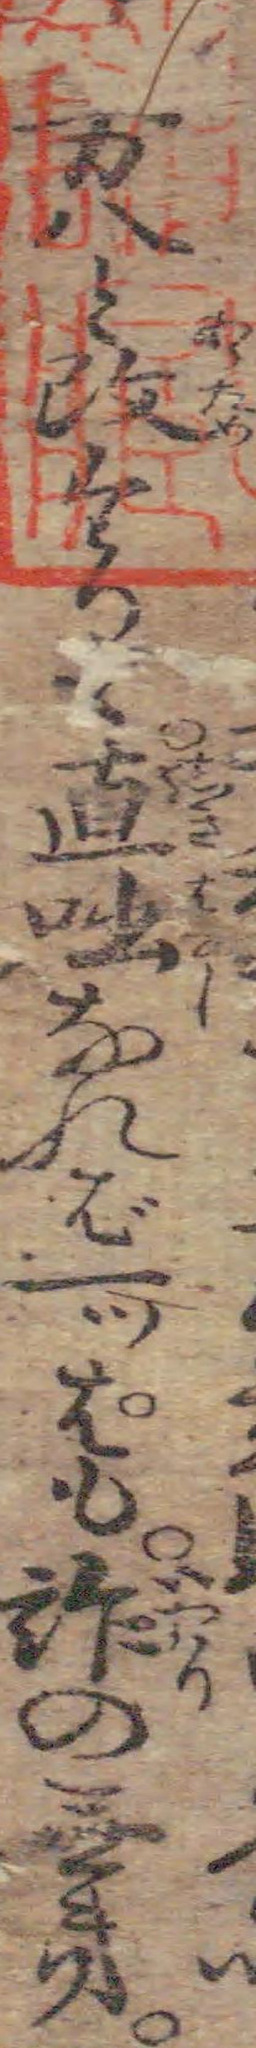万八と改たり。直咄なれば一ッぱも。詐の無き。
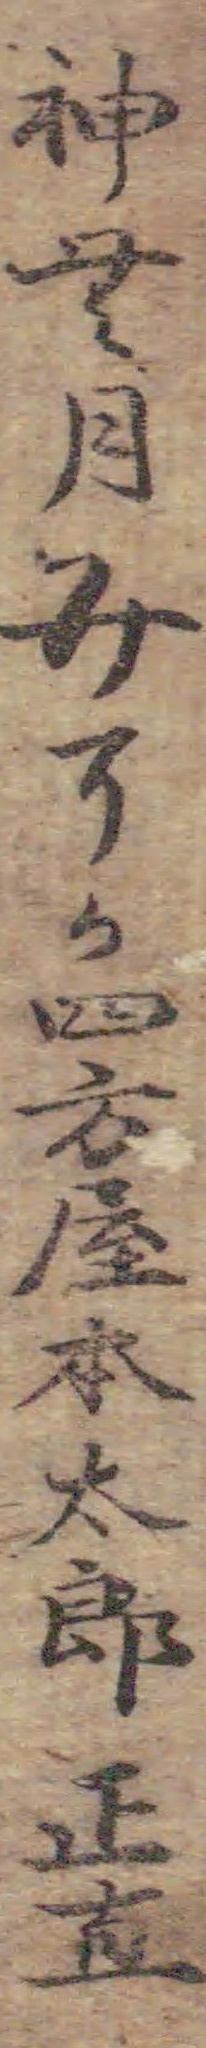神無月みそのみか四方屋本太郎正直
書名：虚言八百万八伝 : 3巻
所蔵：国立国会図書館 National Diet Library, JAPAN
